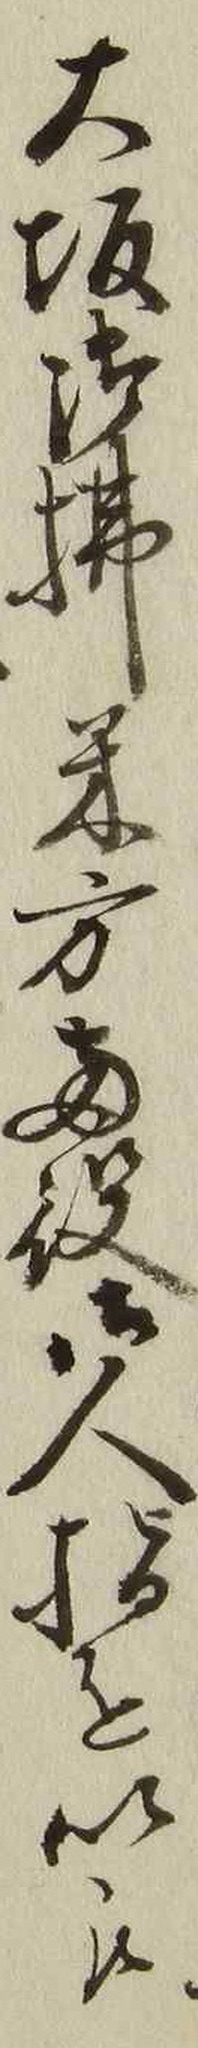大坂御払米方両役御人指を以被
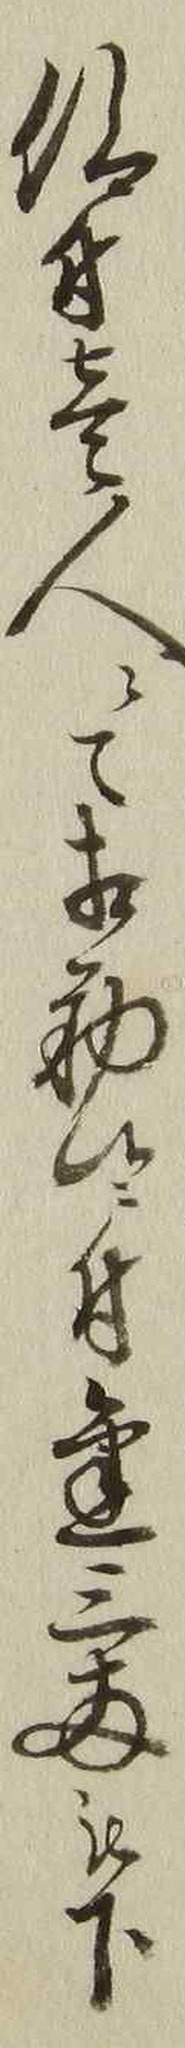仰付壱人ニて相勤候ニ付金三両被下
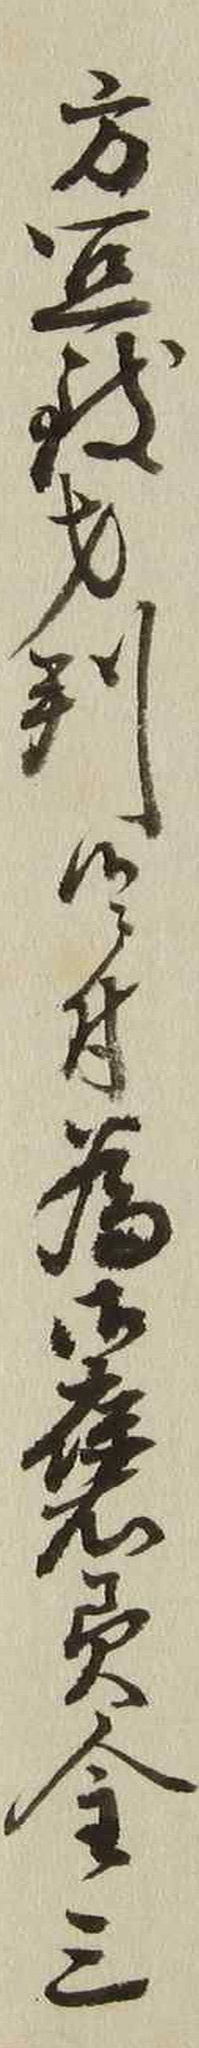方宜致才判候ニ付為御褒美金三
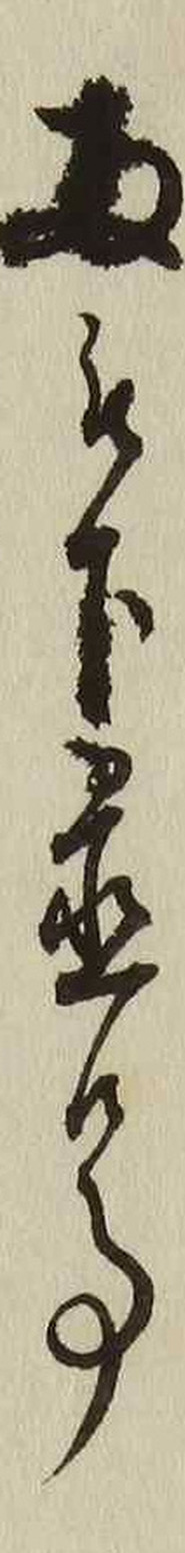両被下置候事
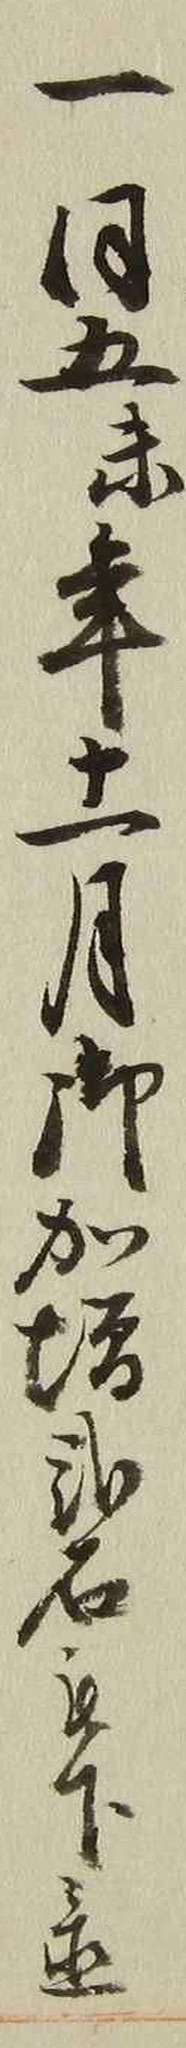一同五未年十一月御加増弐石被下置
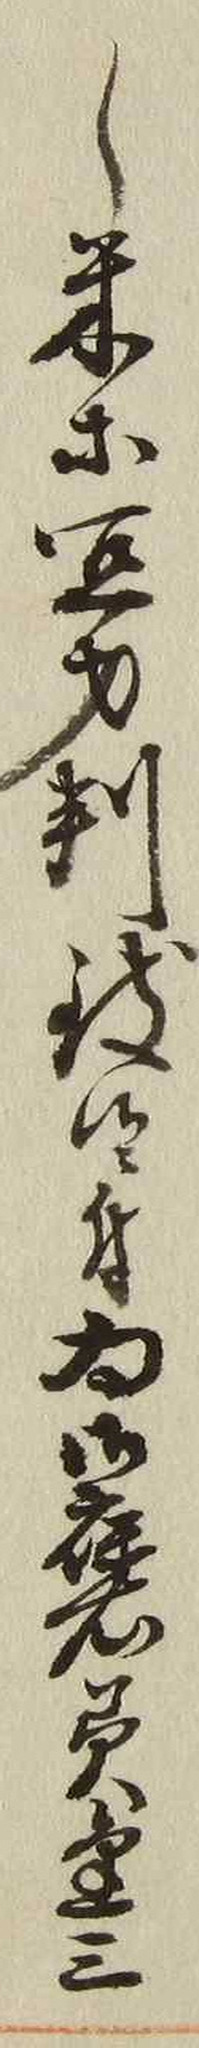し米等宜才判致候ニ付為御褒美金三
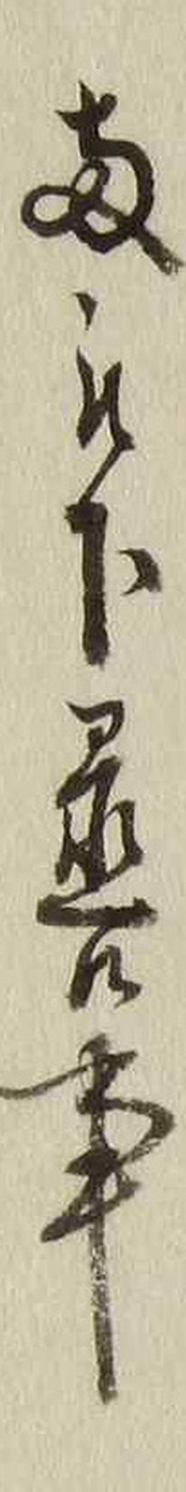両被下置候事
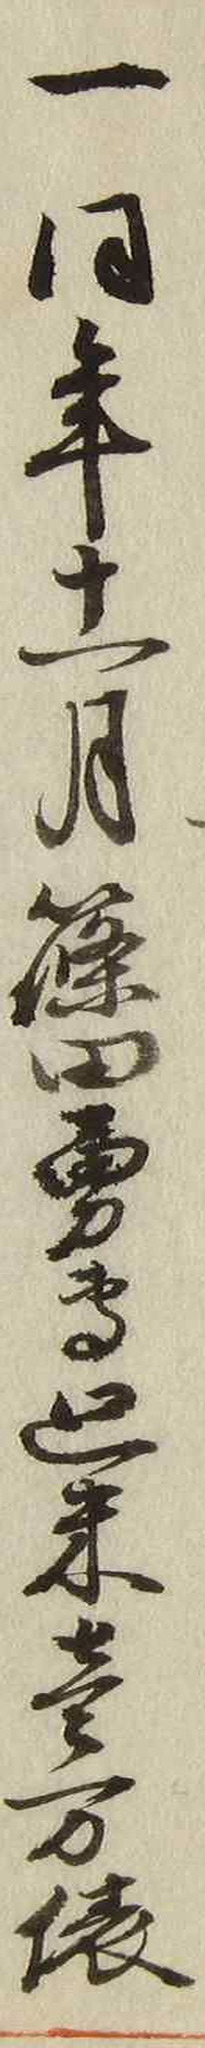一同年十一月篠田勇専廻米壱万俵
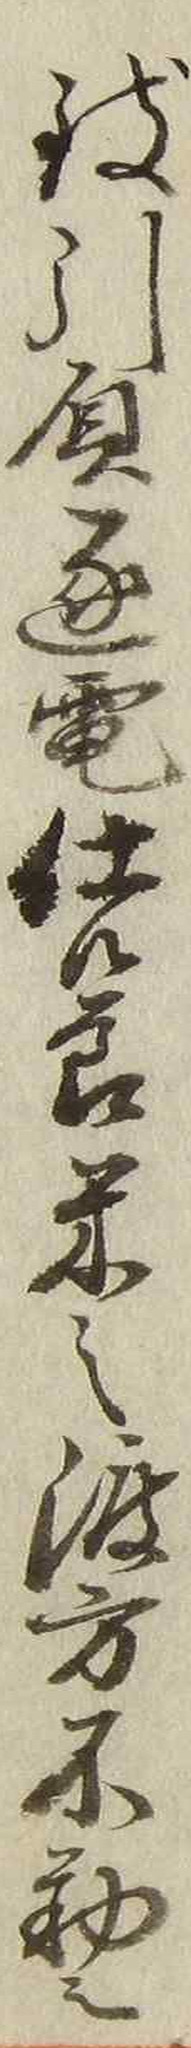致引負逐電仕候節米之渡方不勤之
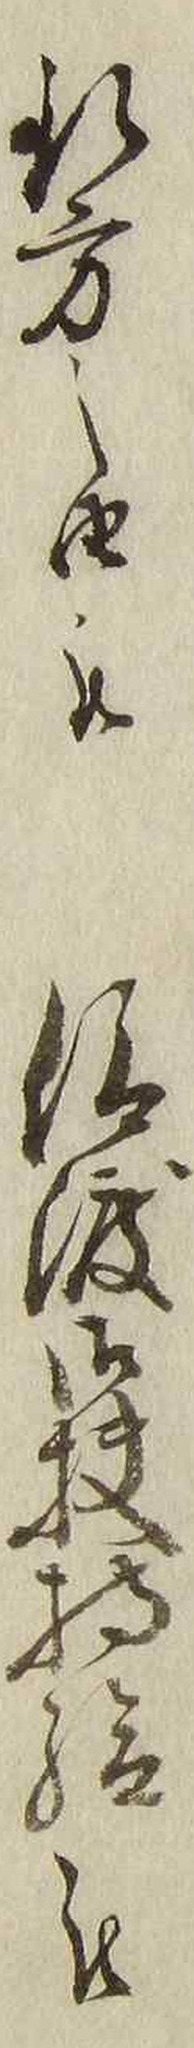致方之由被仰渡御扶持給被
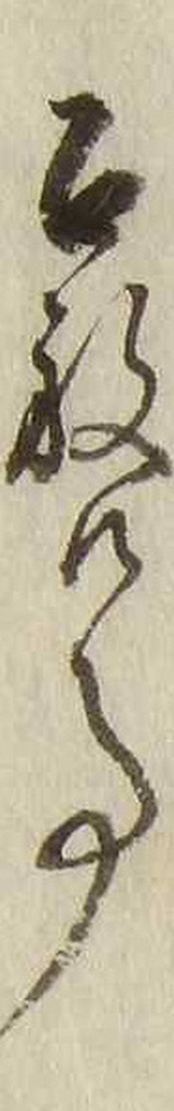召放候事

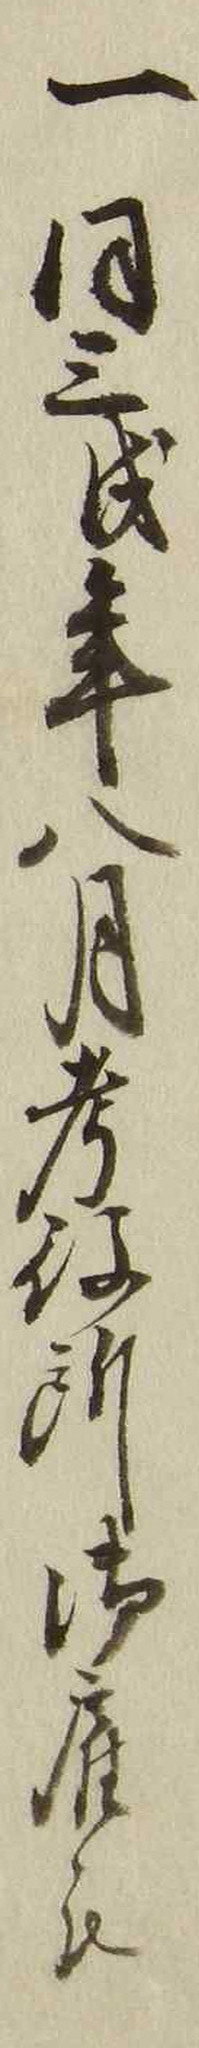一同三戊年八月考役所御雇被
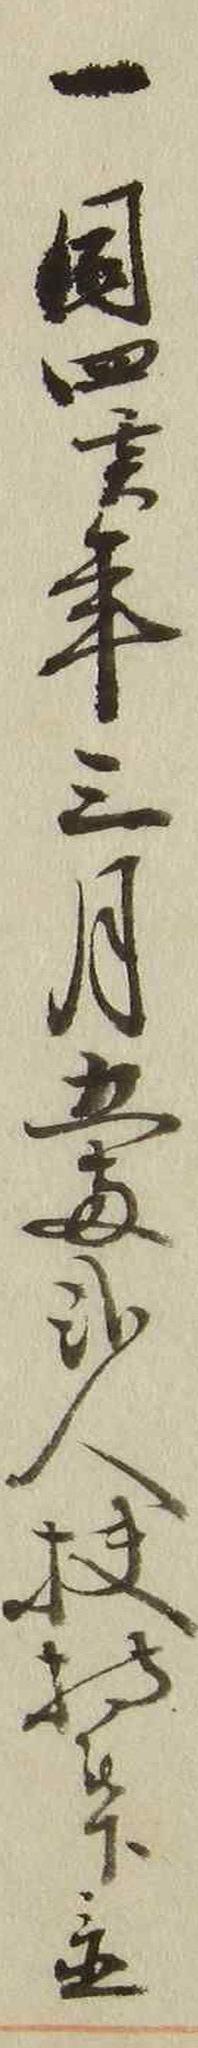一同四亥年三月五両弐人扶持被下置
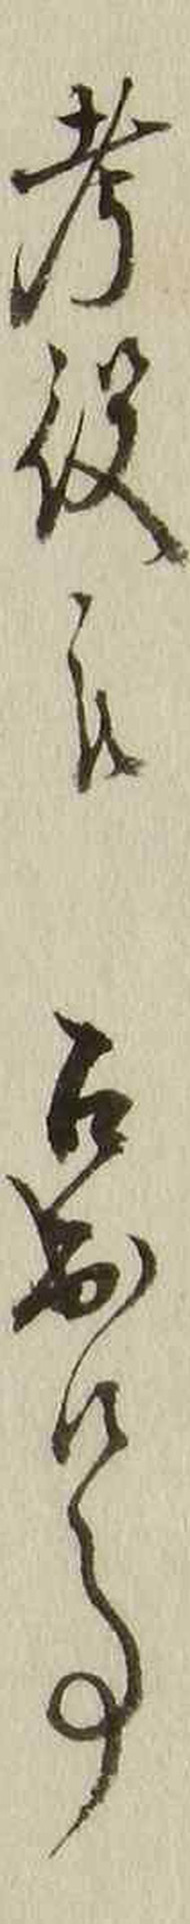考役被召出候事
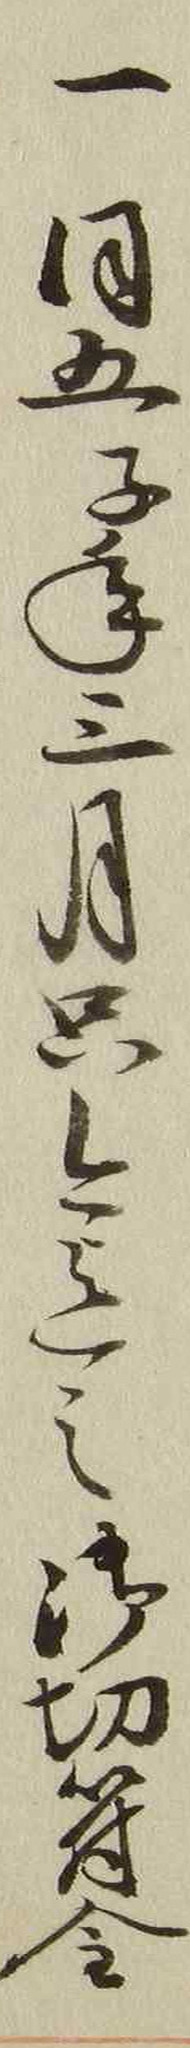一同五子年三月只今迄之御切符金
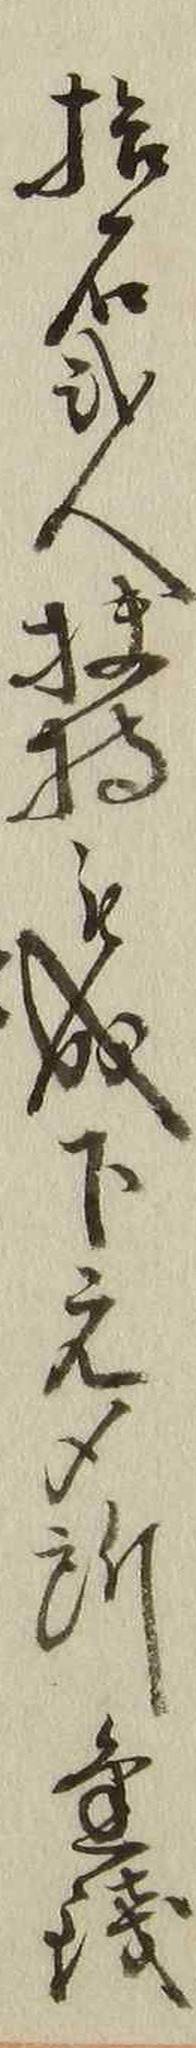拾石人弐扶持被成下元〆所金銭
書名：諸士系譜　巻之27　い之部27
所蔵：会津若松市立会津図書館
